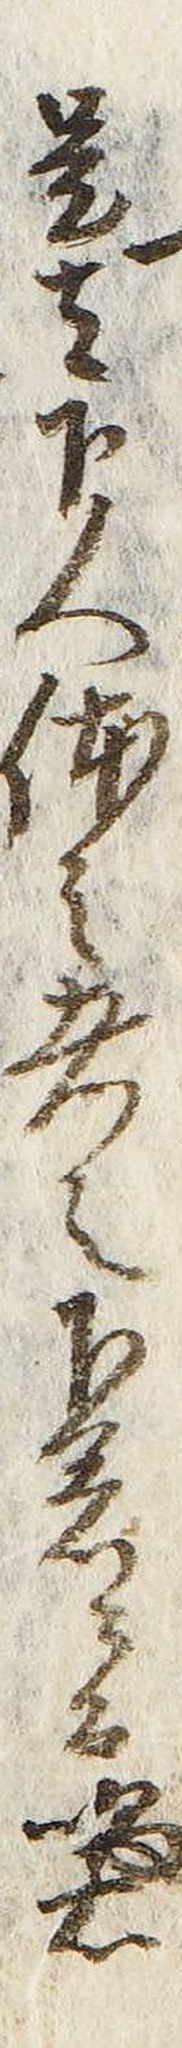是者下人体之者之下着ニ而唱右
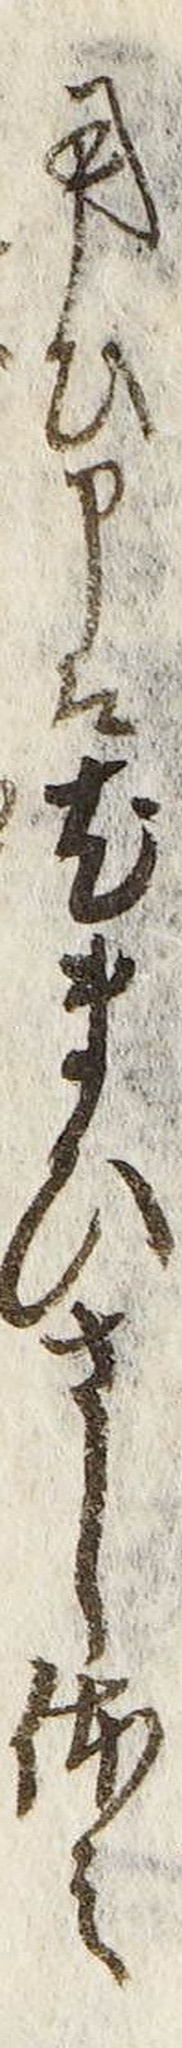用ひ申候尤まひさし体之
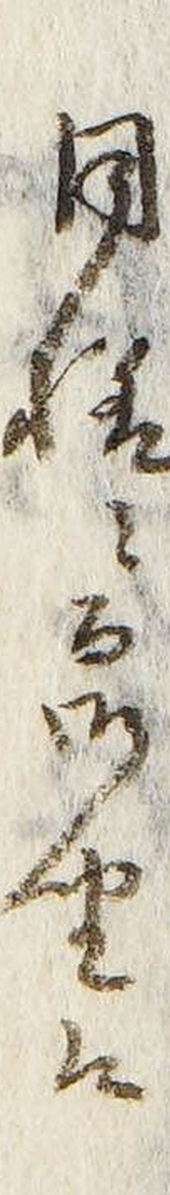同様ニ而御座候
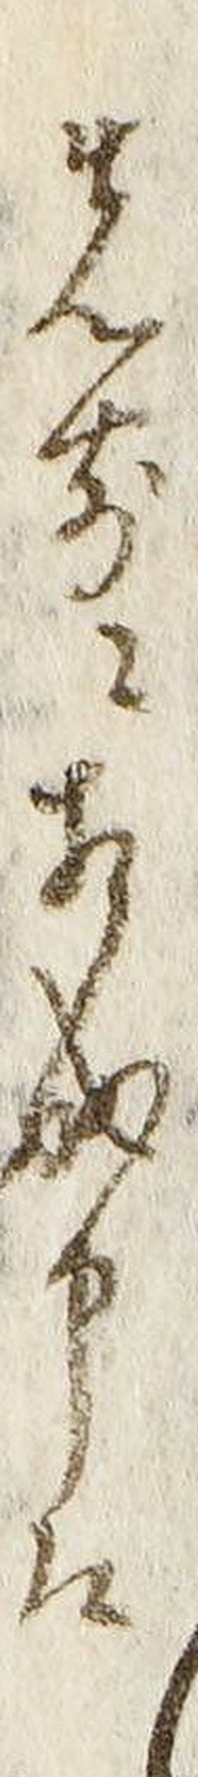先前ニ相成申候
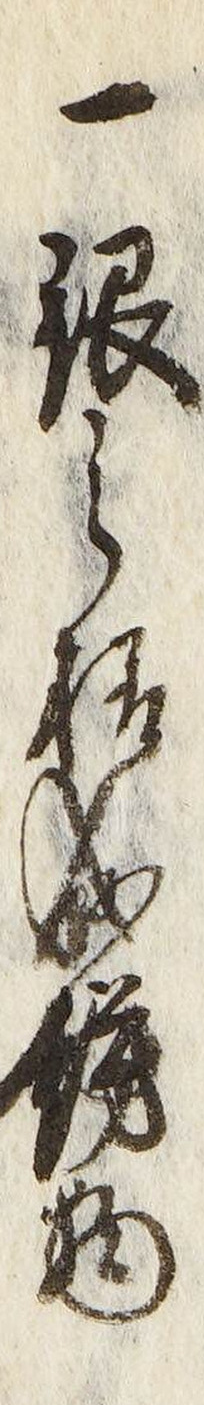一銀之様成餝物二
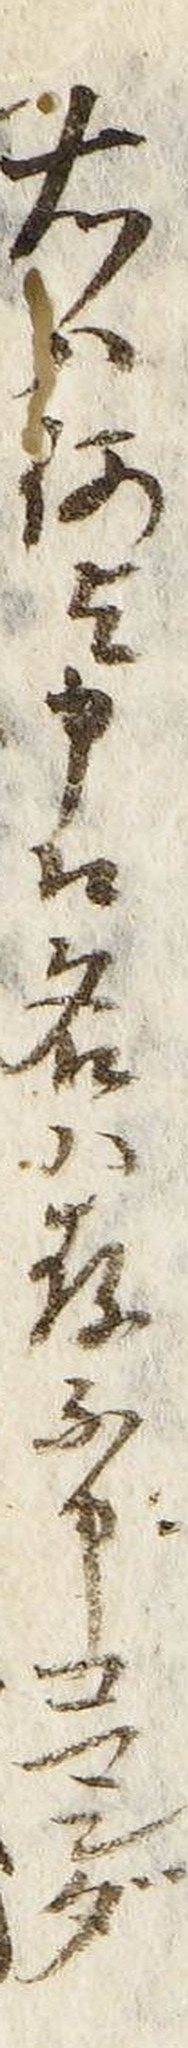右ハ何と申候名ハ存不申コマンダ
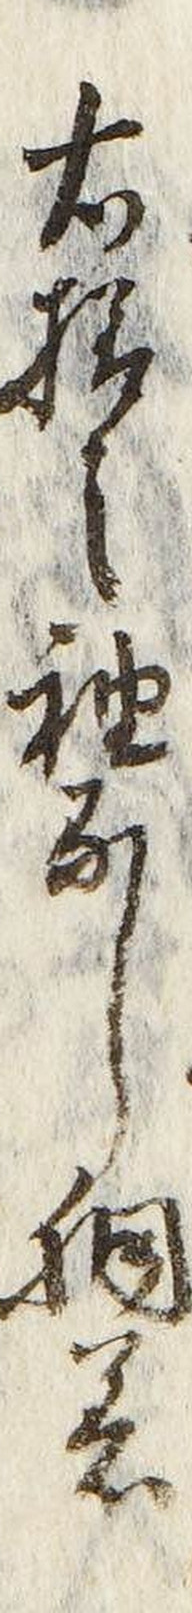右様之袖なし胴着
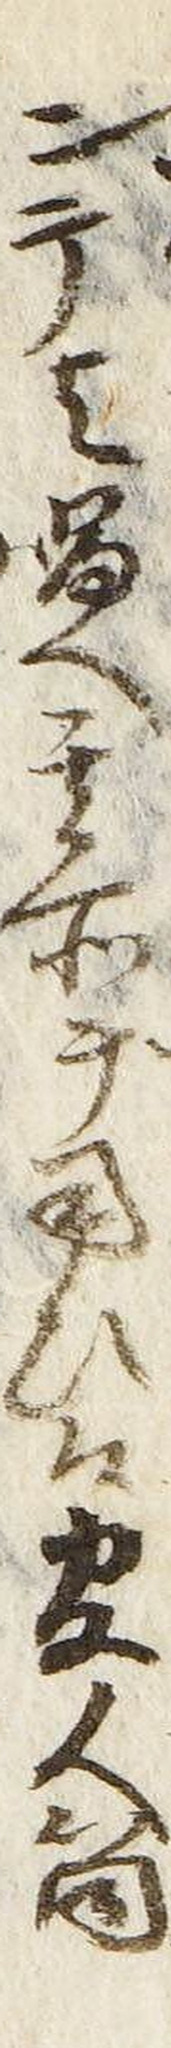ンテと唱へ其所ヲ司ひ候官人筒
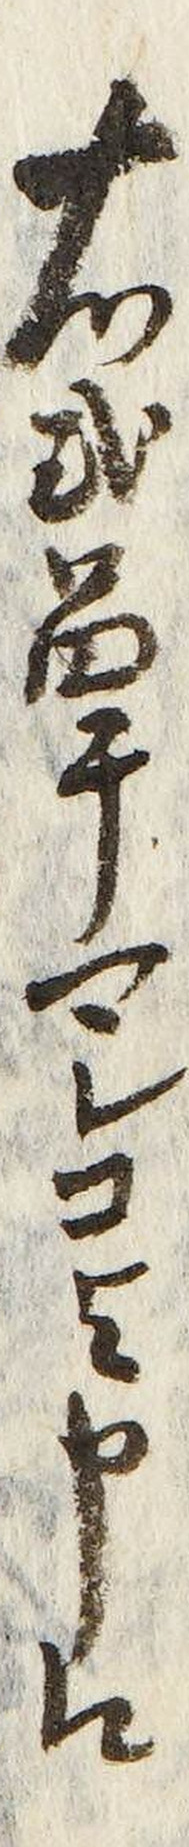右弐品チマレコと申候
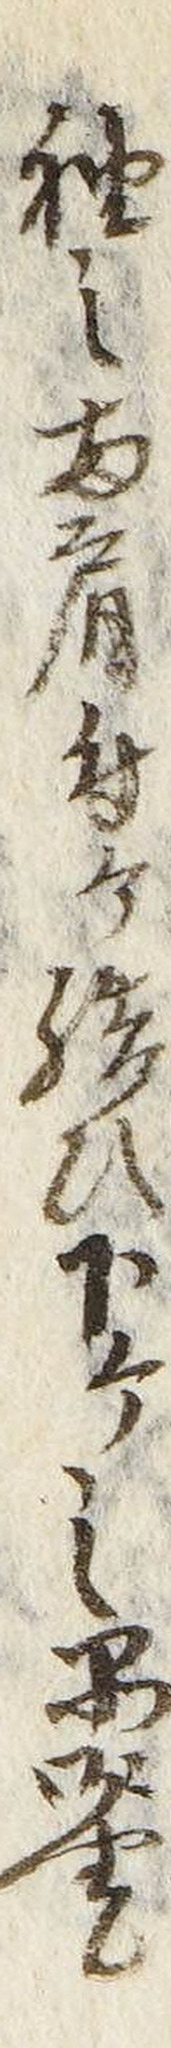袖之両肩付ケ結ひ下ケ之品御座候
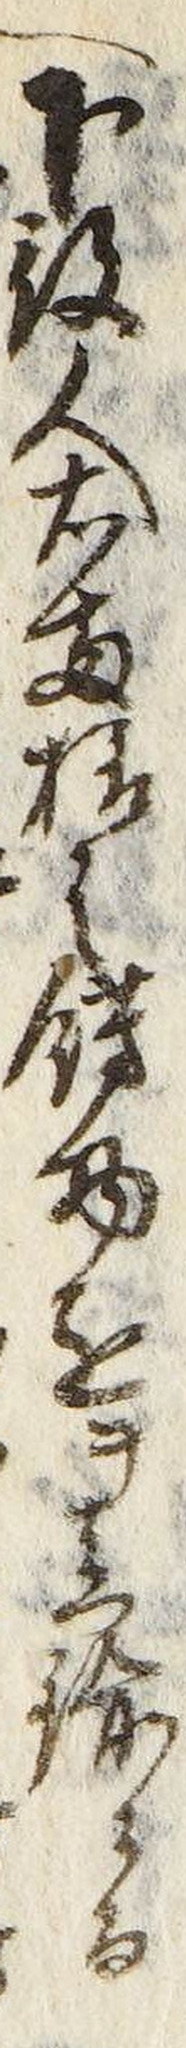下役人右両様之餝物懸ヲ真鍮ニ而
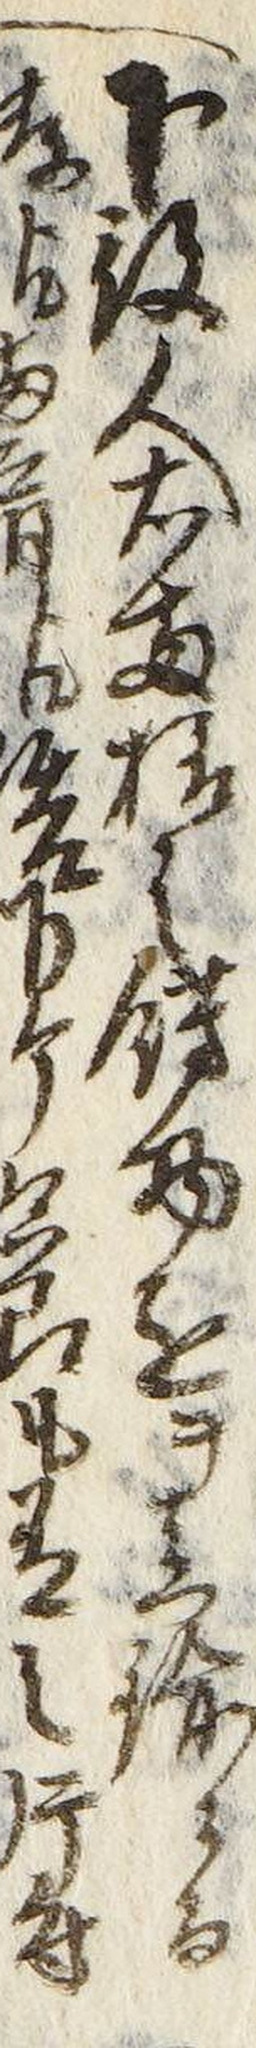拵江両肩江結下ケ候節も有之片付
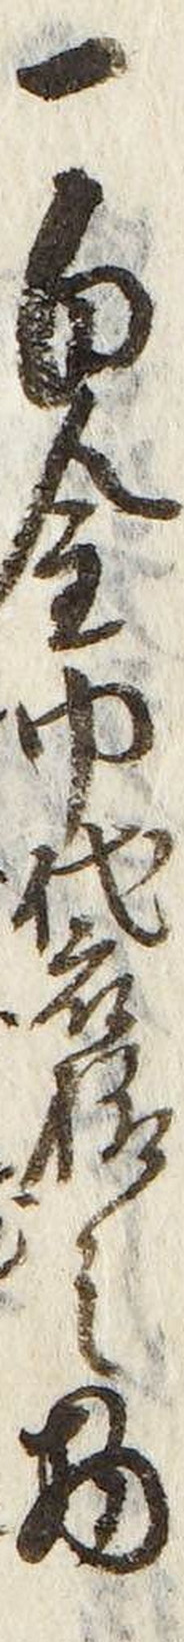一白金巾袋様之物四
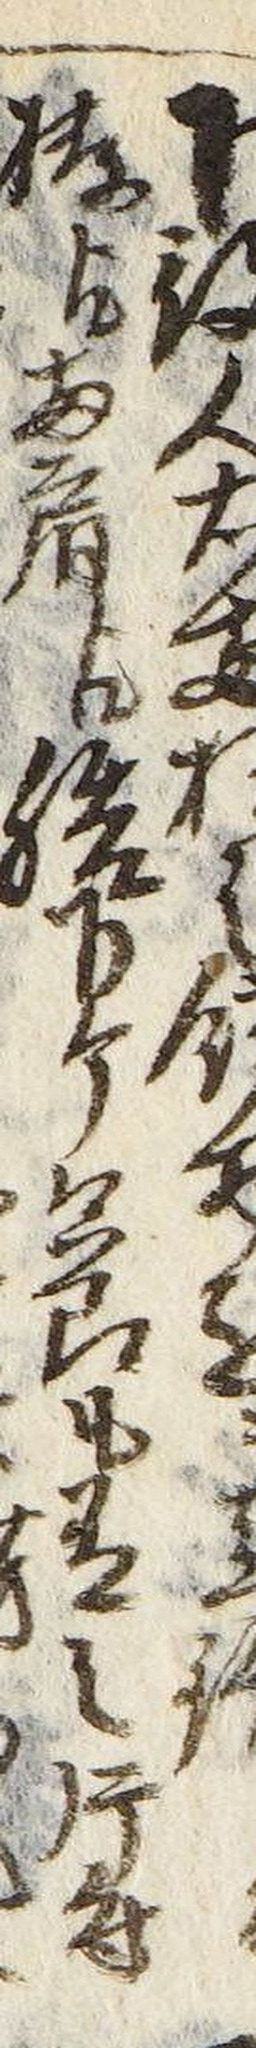拵江両肩江結下ケ候節も有之片付
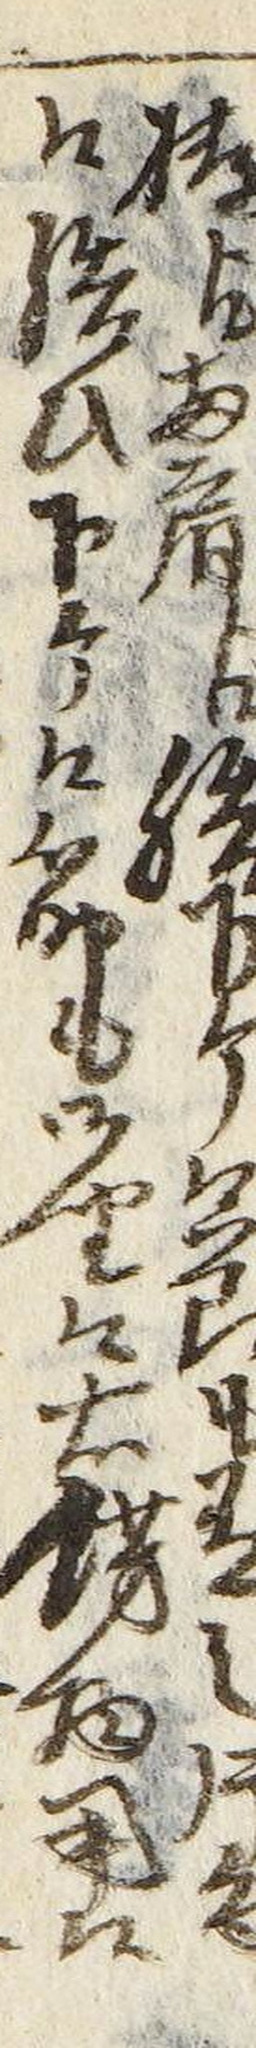候結ひ下ケ候節も御座候餝物用候
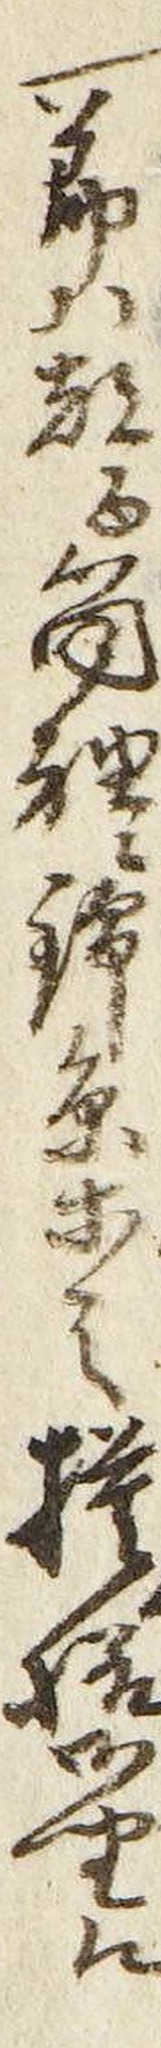節ハ都而筒袖ニ錦糸等之模様御座候
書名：漂流人善助聞書
